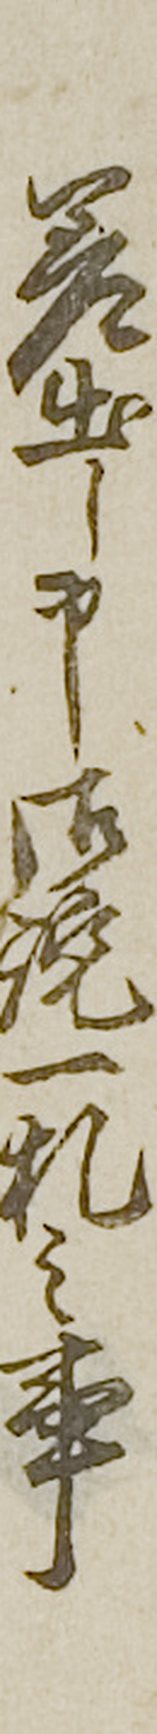差出し申御詫一札之事
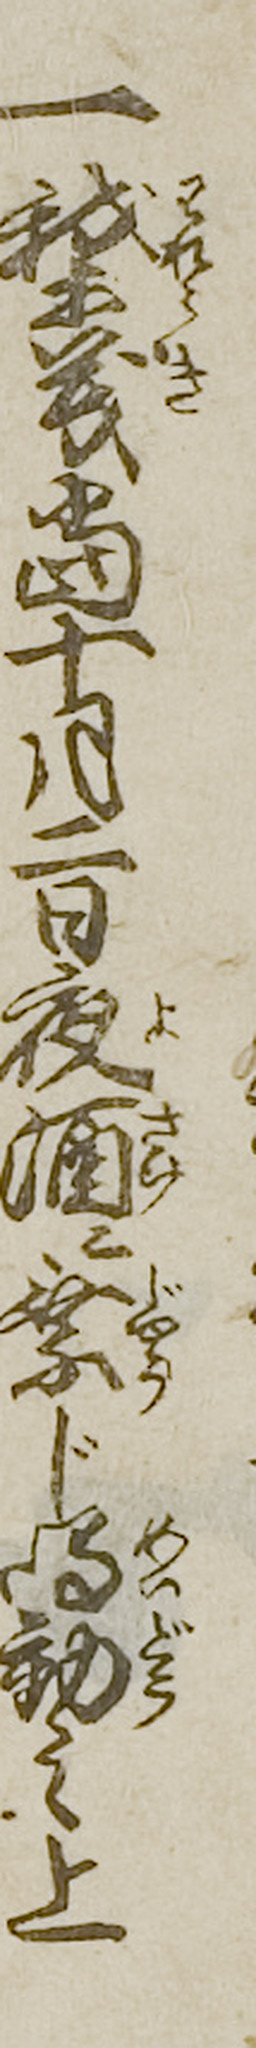一我等義当十月二日夜酒に乗じ鳴動の上
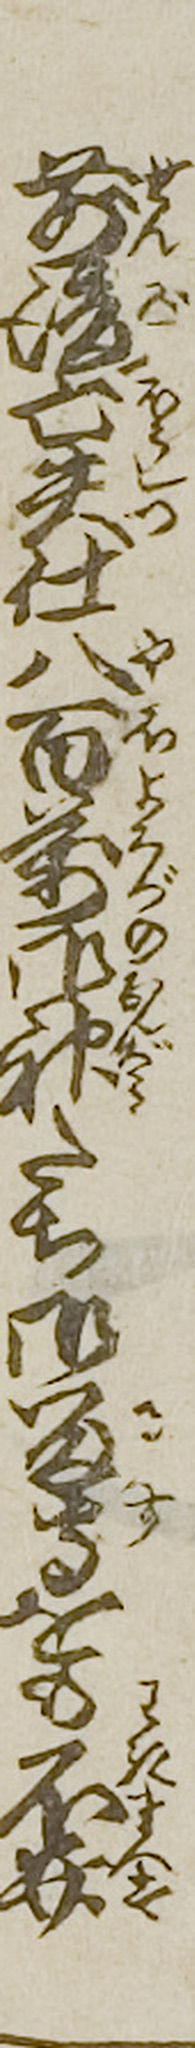前後亡失仕八百萬御神たち御留守をも不弁
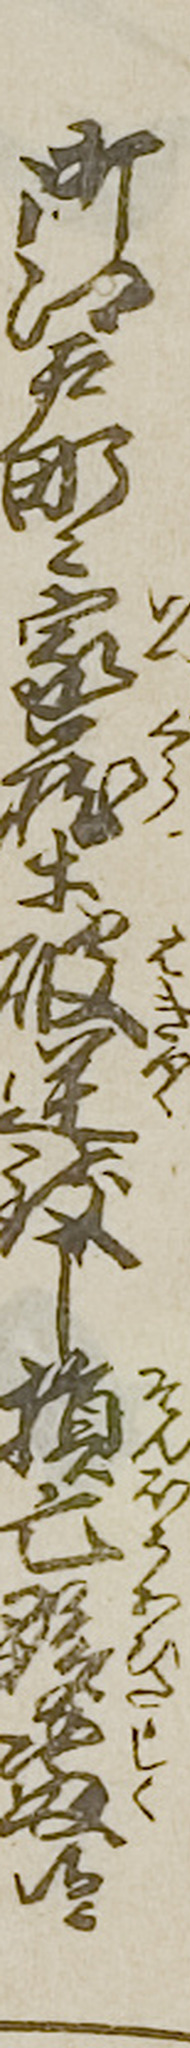御江戸町に家蔵等破逆致し損亡夥敷候に
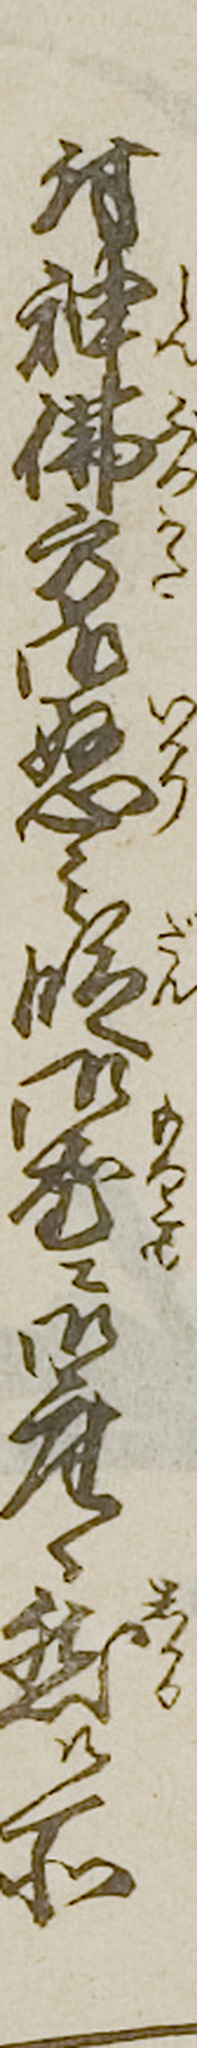付神佛方御怒の段御尤に御座候然る所
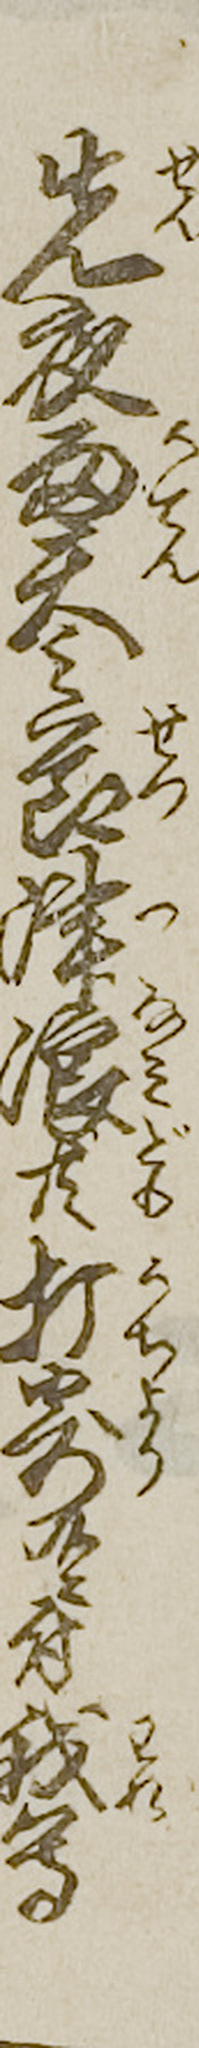先夜雨天の節津浪共打寄候に付我等
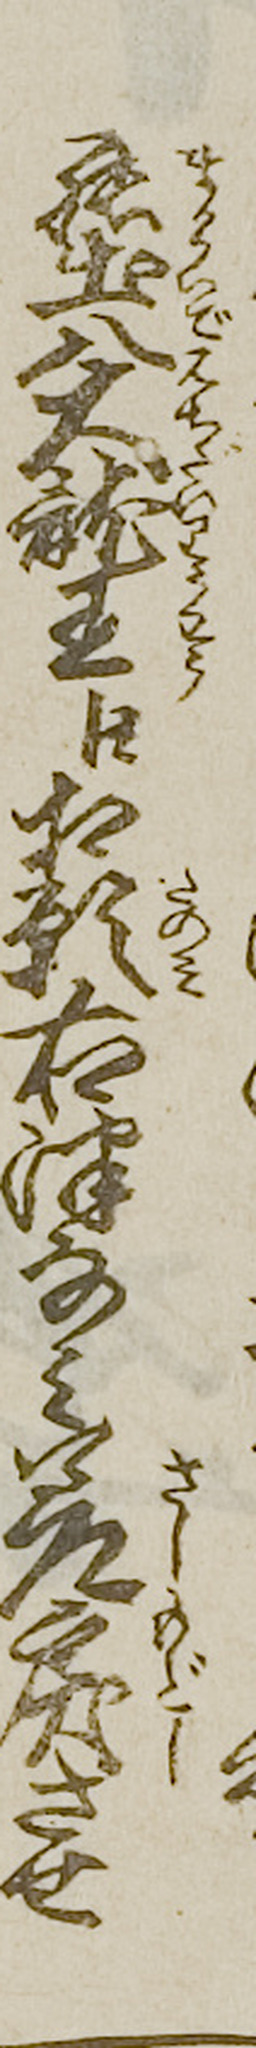罷出八大龍王江相願右津なみ差戻させ
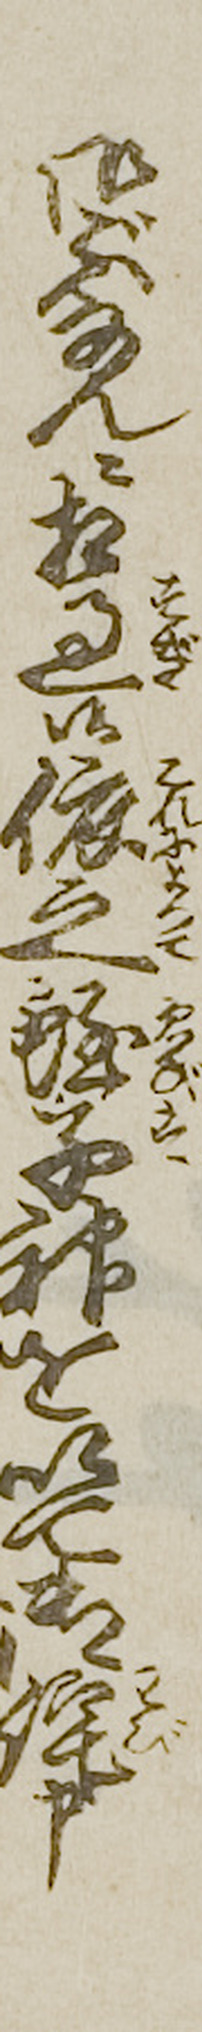御ぶなんに相過候依之蛭子神を以て御詫申
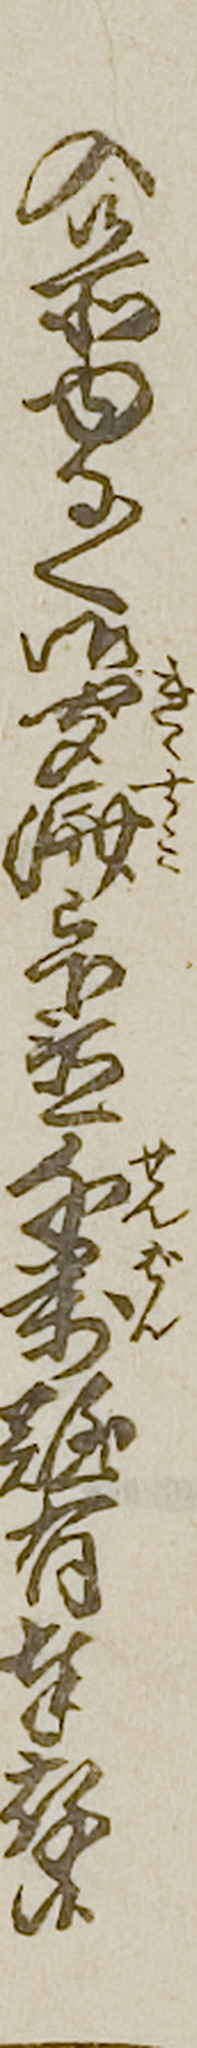入候所ゆる〳〵御聞済被下置千萬難有奉存候
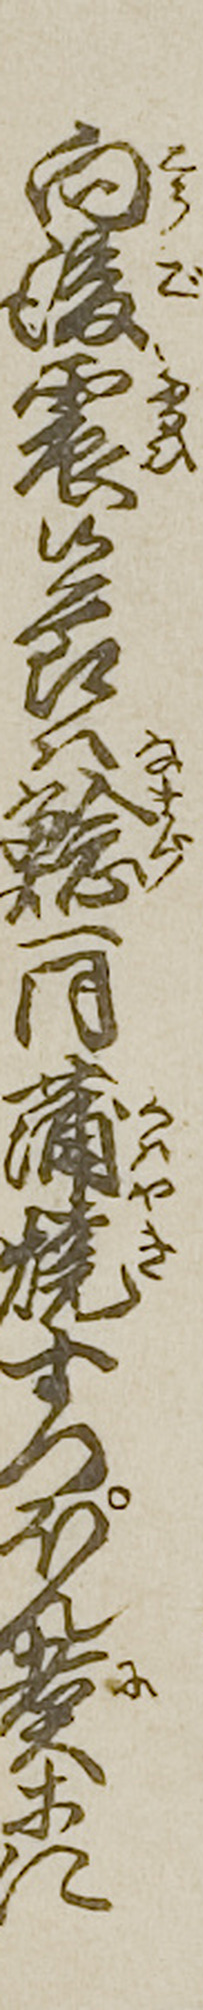向後震候節は鯰一同蒲焼すつぽん煮等に
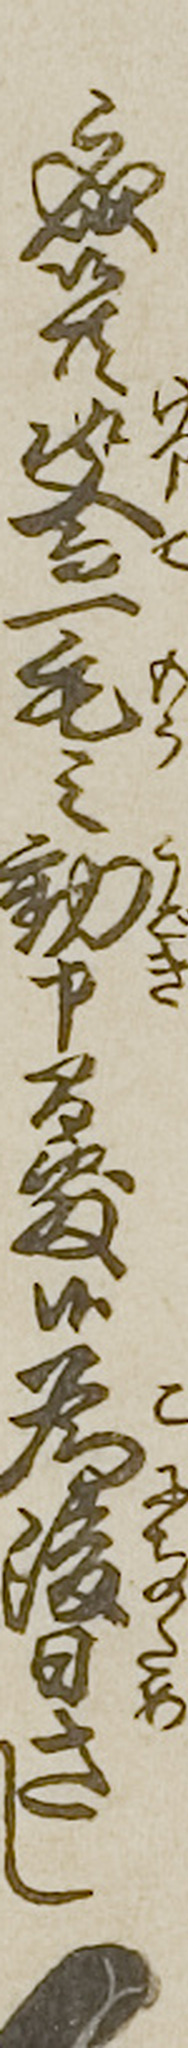被成候共決而一毛の動申間敷候為後日さし
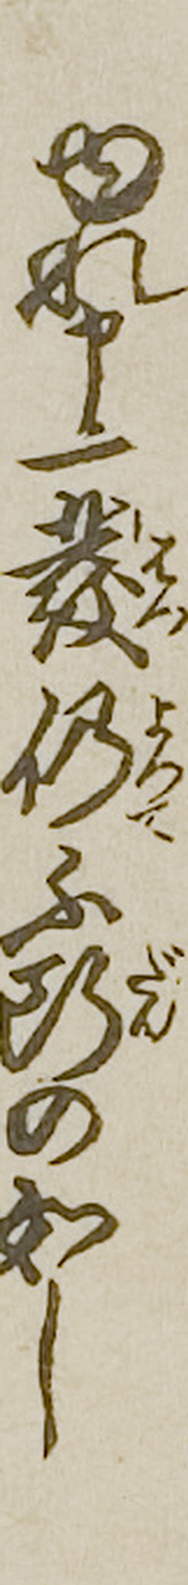ゆれ申上一発仍ふ断の如し
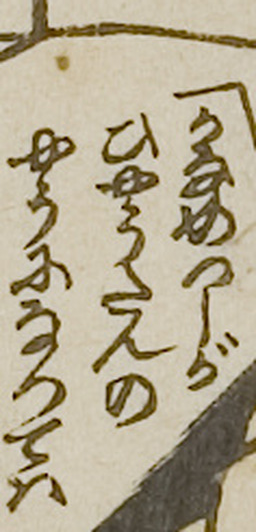ひやうたんの
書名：差出し申御詫一札之事
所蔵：東京大学総合図書館 General Library in the University of Tokyo, JAPAN
